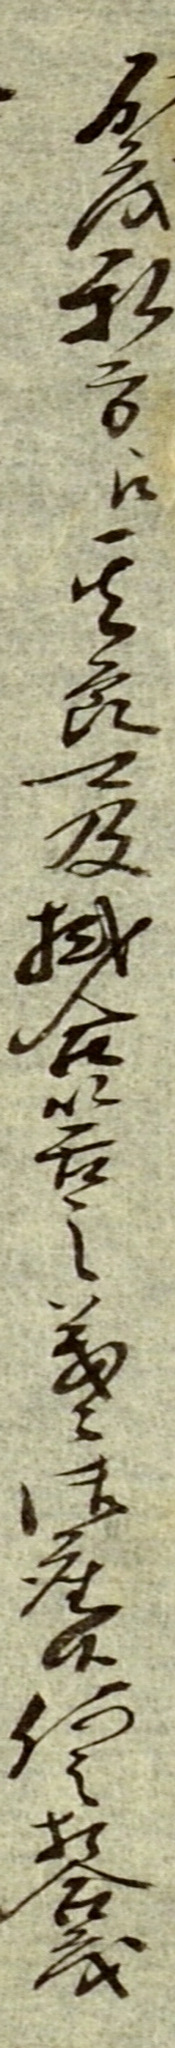ゟ茂私方江其節可及掛合筈之義ニ御座候何之打合茂
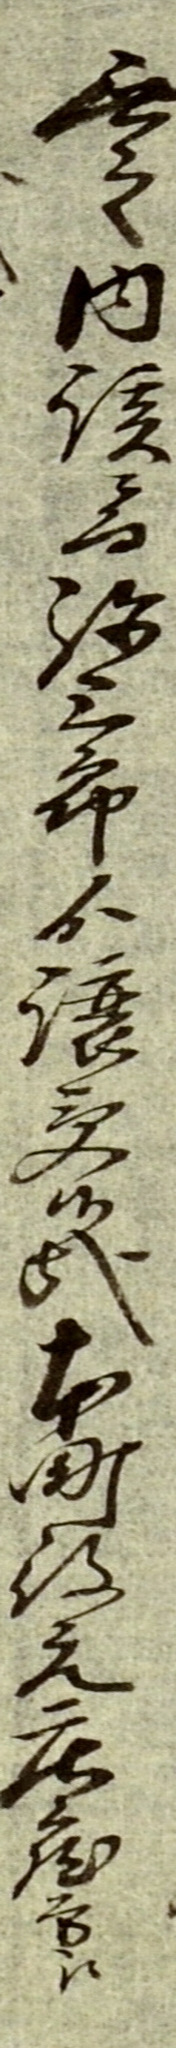無之内段ニ而弥三郎ゟ譲受候哉本町役元庄蔵方江
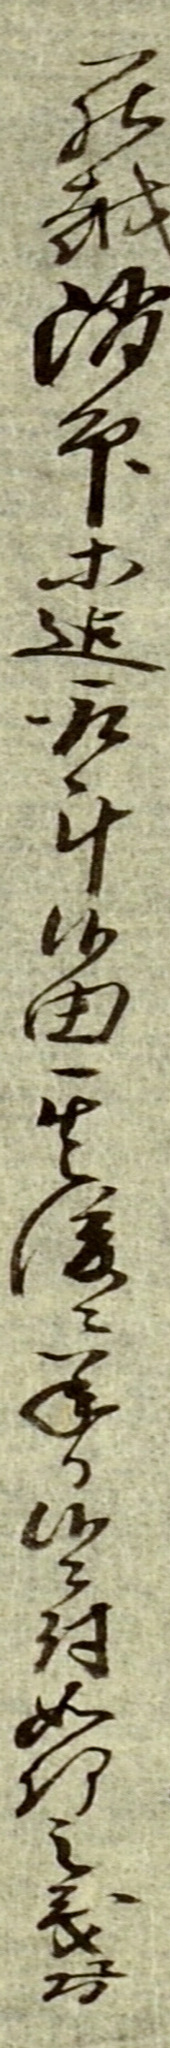罷越消印等迄取計候由其後ニ承り候ニ付如何之義ニ而
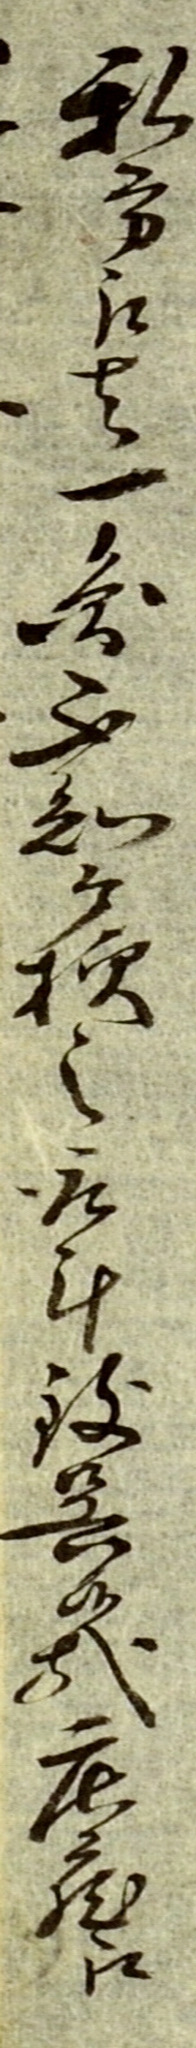私方江者一円不知ケ様之取計致呉候哉庄蔵江
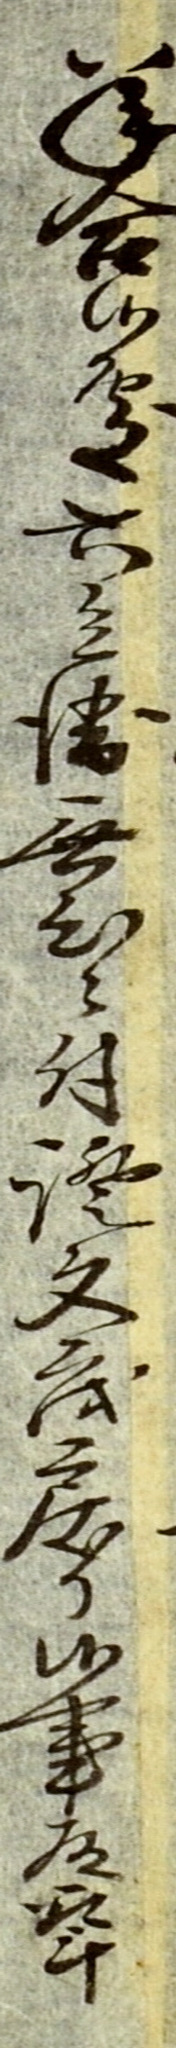承合候処六兵衛無心ニ付証文茂戻り候事故取斗
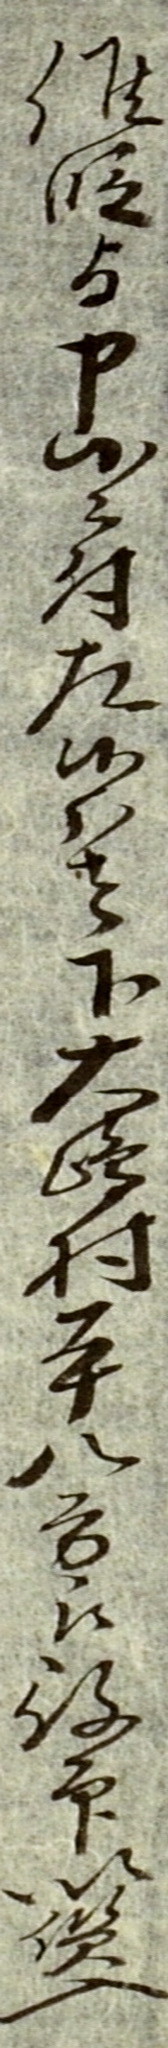候段と申候ニ付左候ハ者下大島村平八方江役印以質入
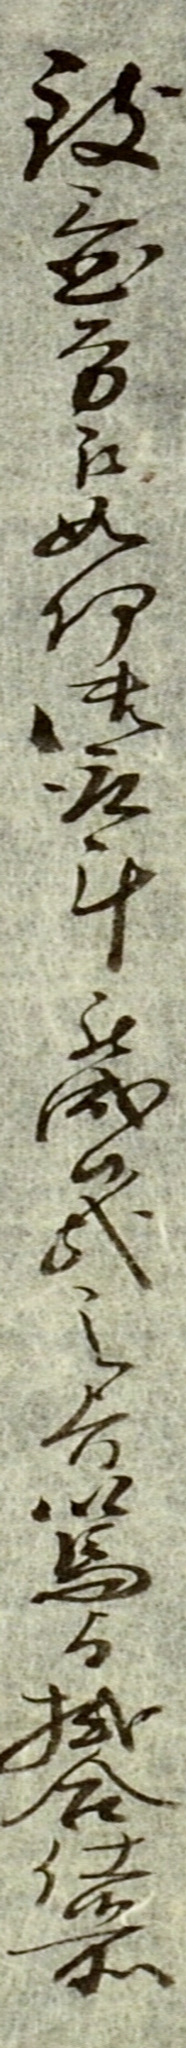致置方江如何御取計被成候哉之旨篤と掛合仕候所
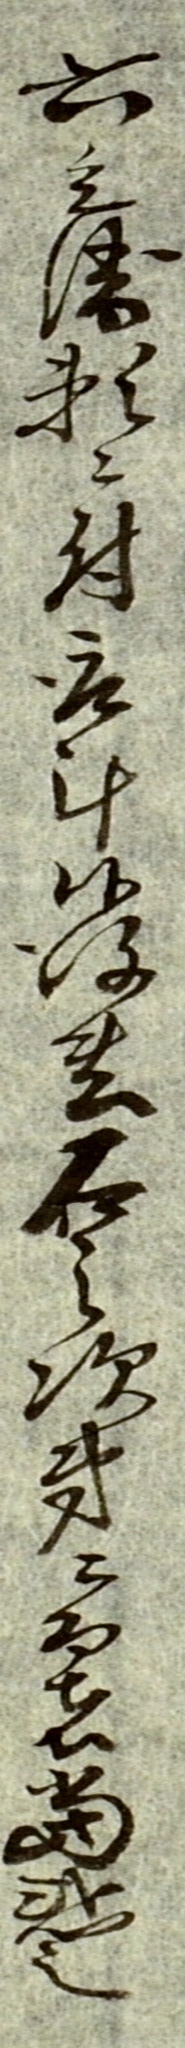六兵衛願ニ付取計候得共右之次第ニ而者当惑之
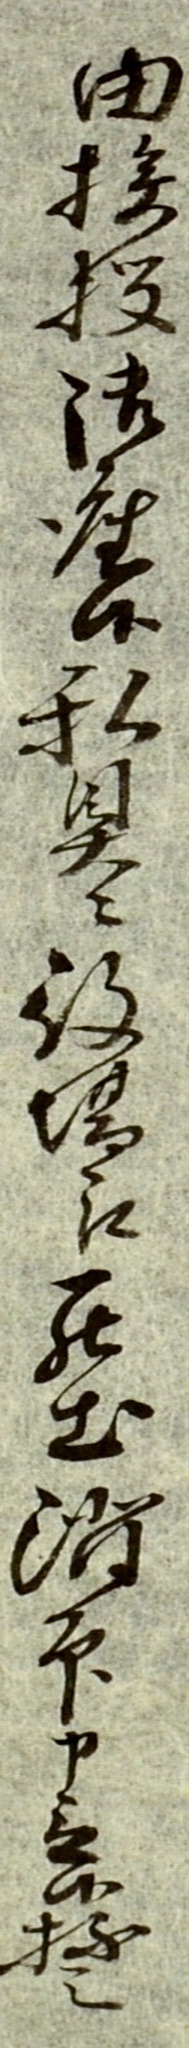由挨拶御座候私具ニ役場江罷出消印申立候抔之
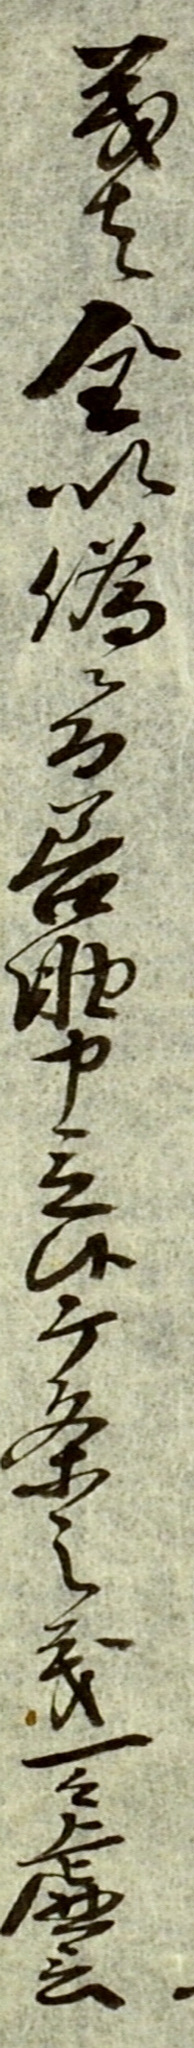義者全以偽ニ而善助申立候ケ条之義一々虚言
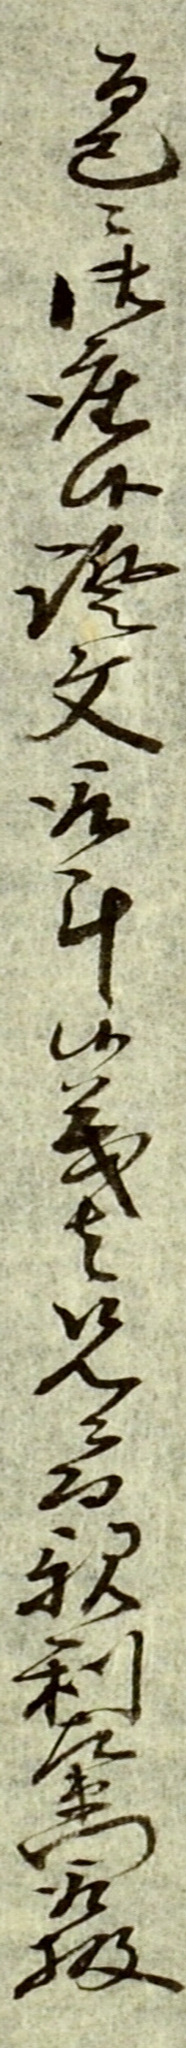而已ニ御座候証文取斗候義者兄ニ而親利左衛門取扱
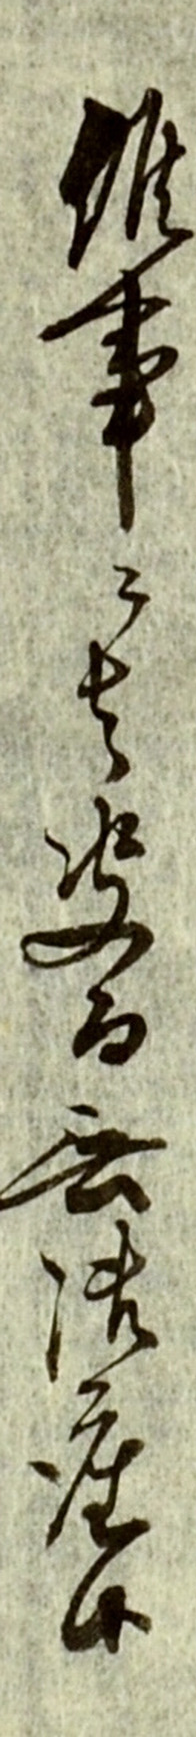候事ニ者決而無御座候
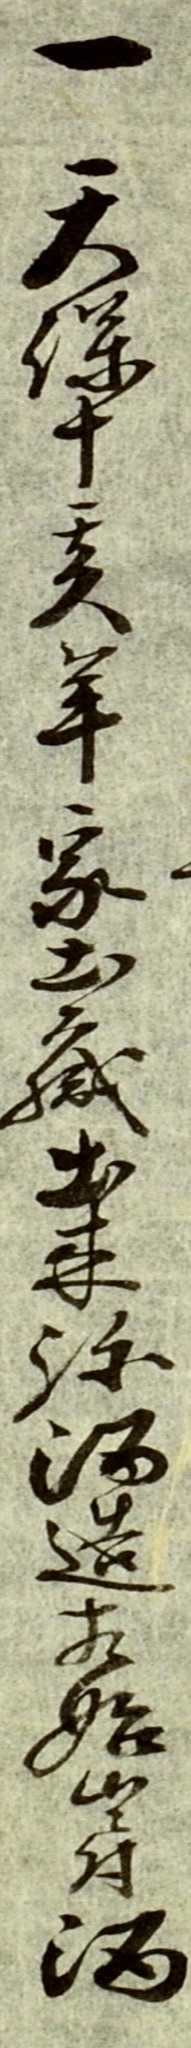一天保十亥年家土蔵出来弥酒造相始候ニ付酒
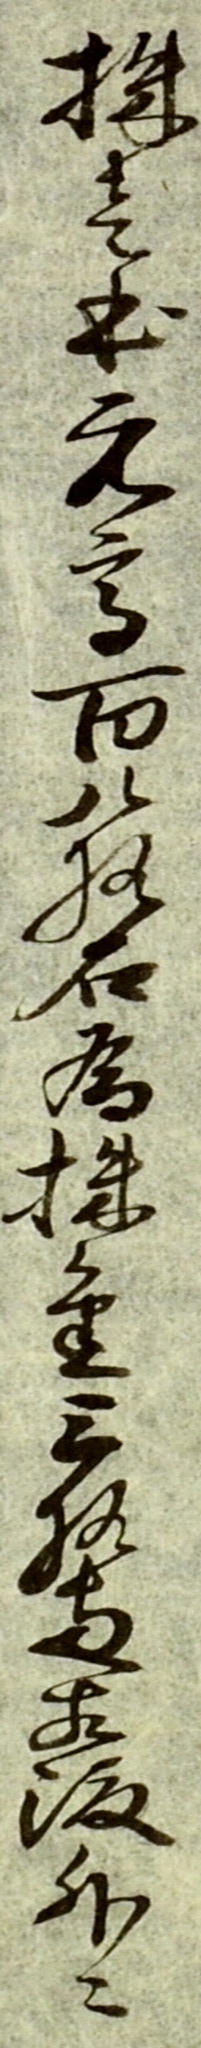株壱本元高百八拾石為株金三拾両相渡外ニ
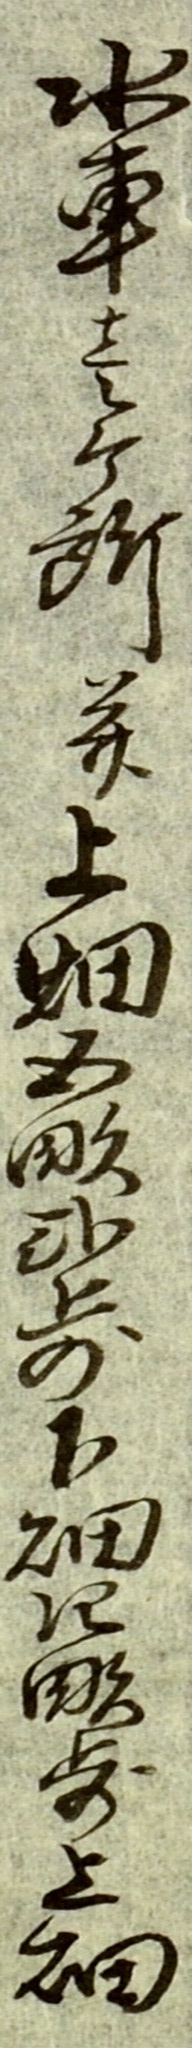水車壱ケ所并上畑五畝弐歩下畑四畝歩上畑
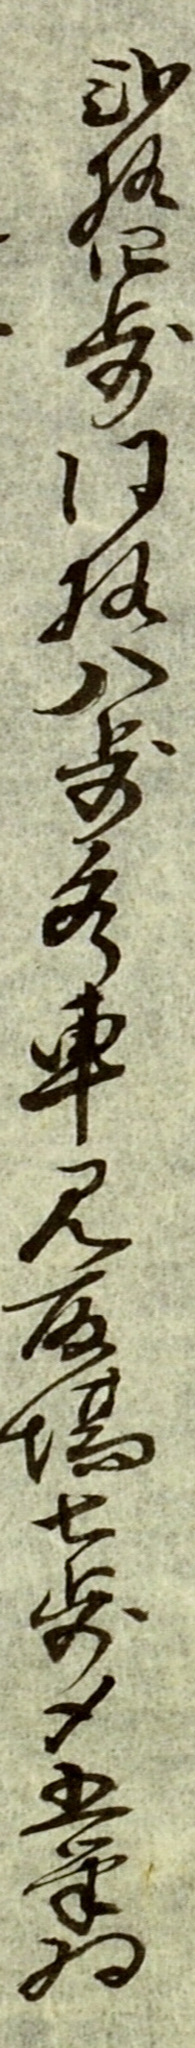弐拾四歩同拾八歩水車見取場七歩〆五筆為
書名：乍恐以口上書奉申上候御事
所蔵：伊那市立高遠町図書館・合同会社AMANE
